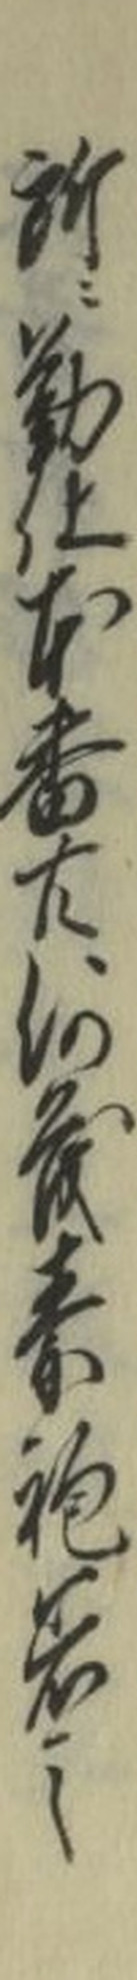所に勤仕本番共何も素袍着之
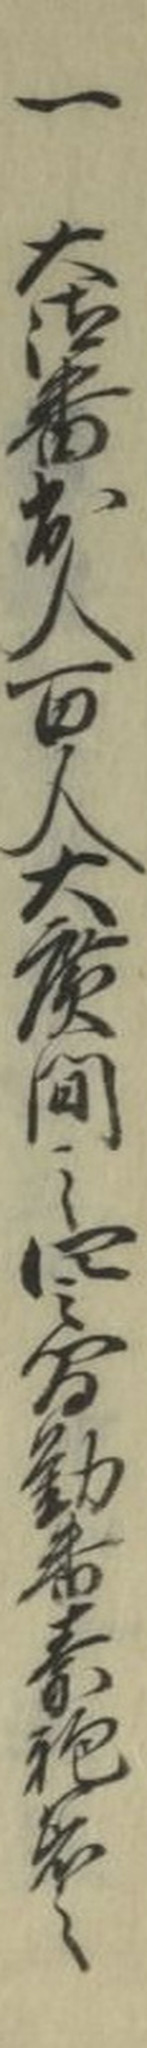一大御番出人百人大広間之四之間勤番素袍着之
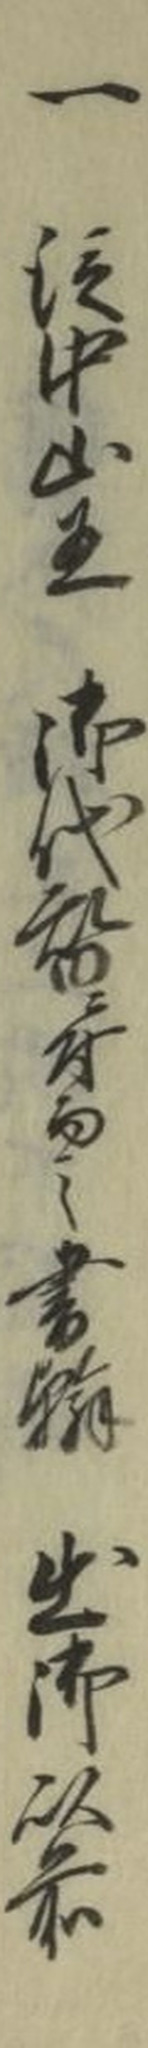一従中山王御代替に付而之書翰出御以前
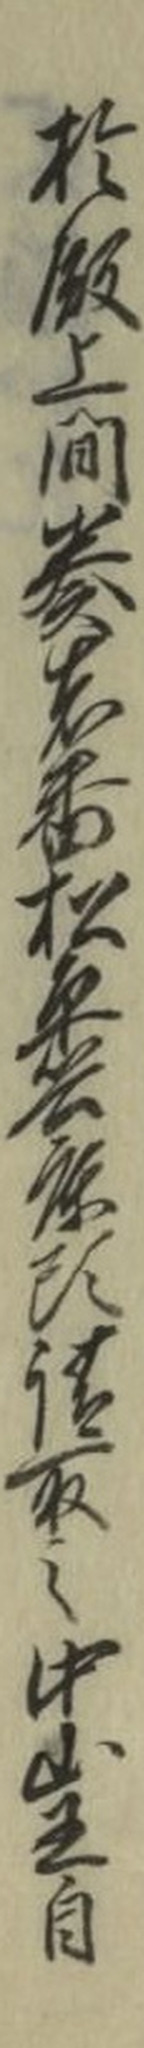於殿上間奏者番松平兵庫頭請取之中山王自
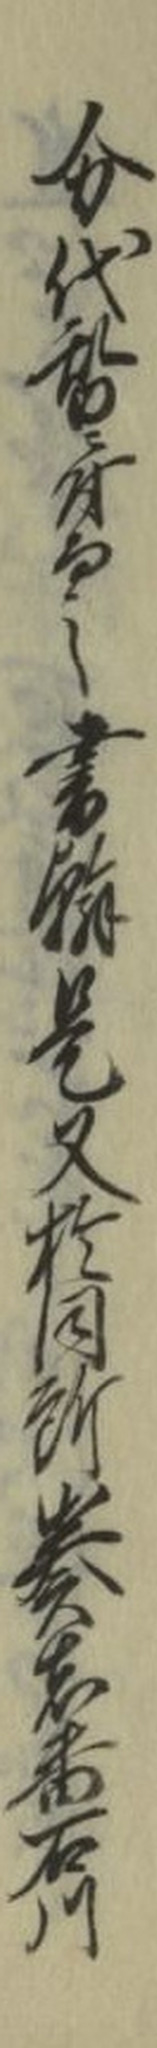分代替に付而之書翰是又於同所奏者番石川

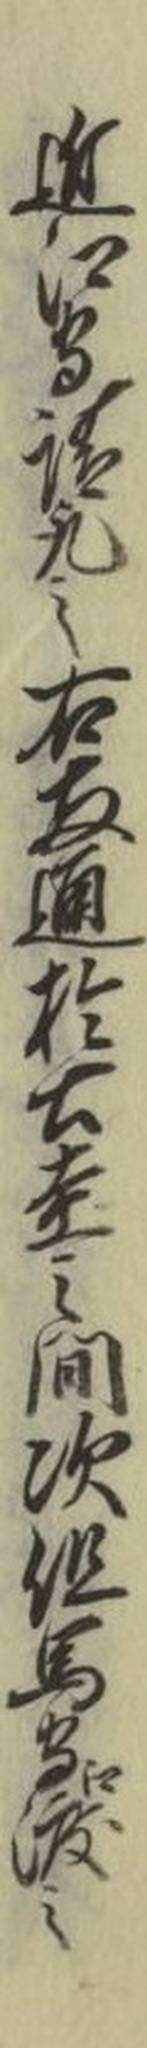近江守請取之右両通於土圭之間次但馬守え渡之
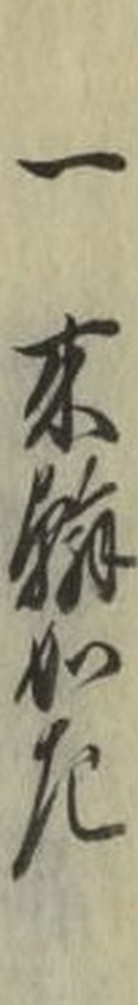一来翰如左
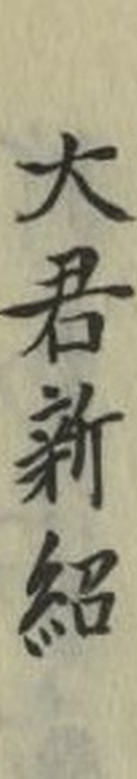大君新紹
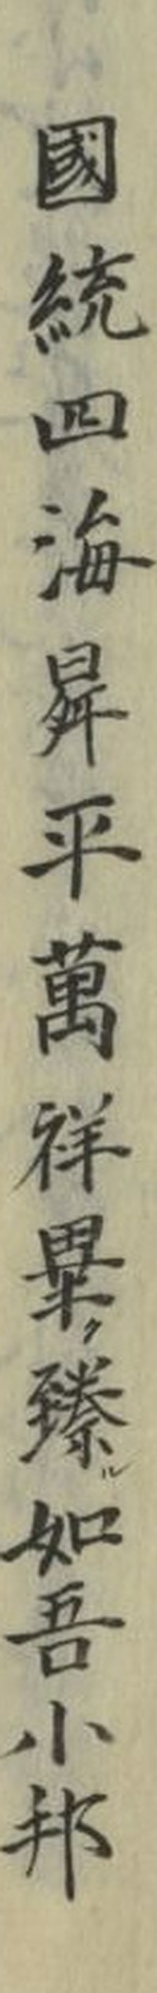国統四海昇平萬祥畢臻如吾小邦
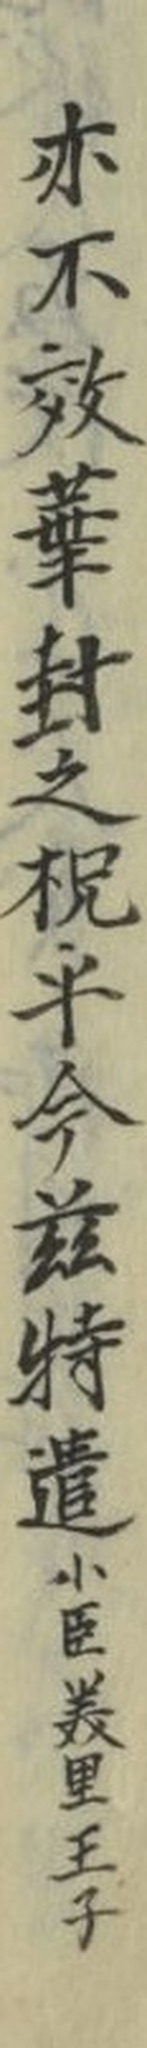亦不効華封之柷乎今茲特遣小臣美里王子
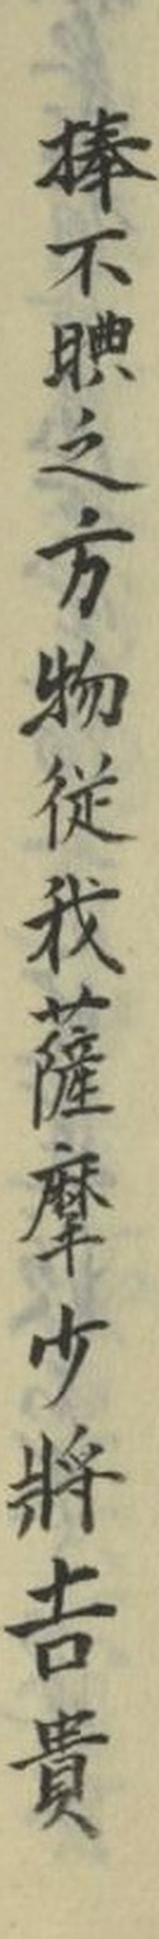捧不腆之方物従我薩摩少将吉貴
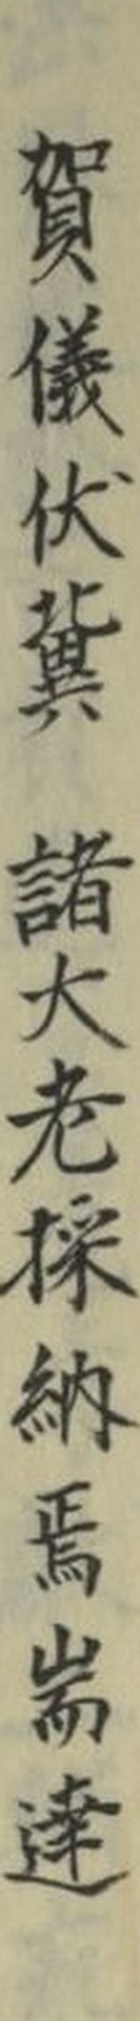賀儀伏冀諸大老採納焉耑達
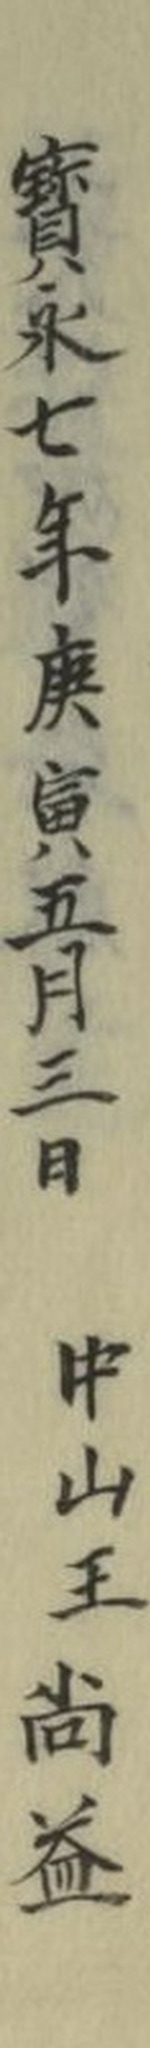宝永七年庚寅五月三日中山王尚益
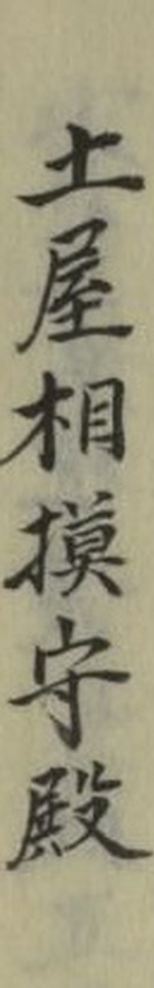土屋相模守殿

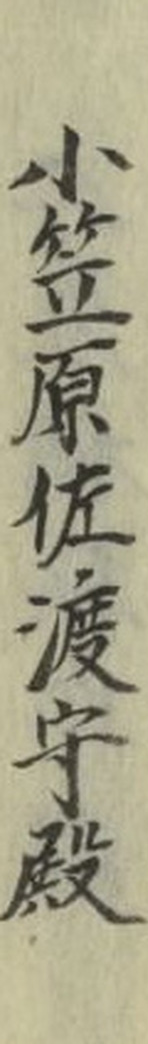小笠原佐渡守殿
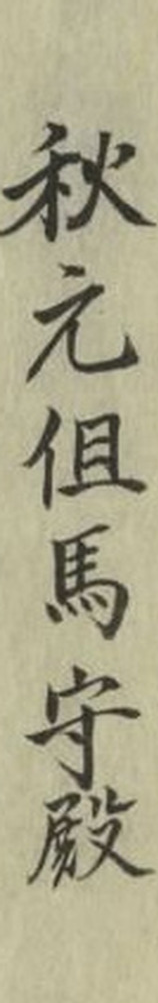秋元但馬守殿
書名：琉球人参府記
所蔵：University of the Ryukyus Library
